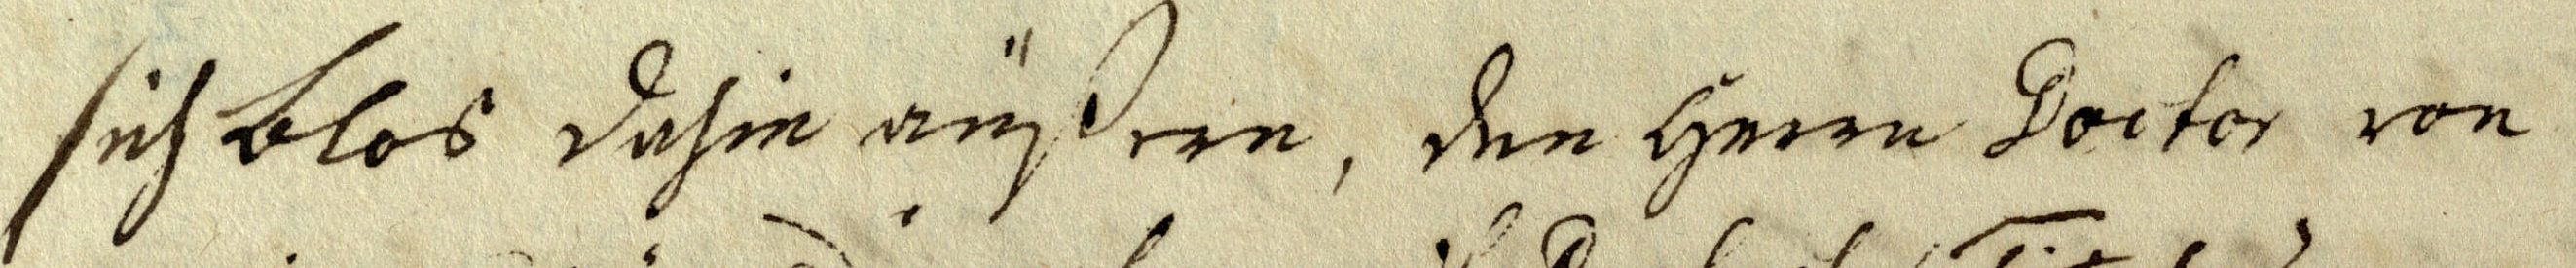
sich blos dahin äußern, den Herrn Doctor von
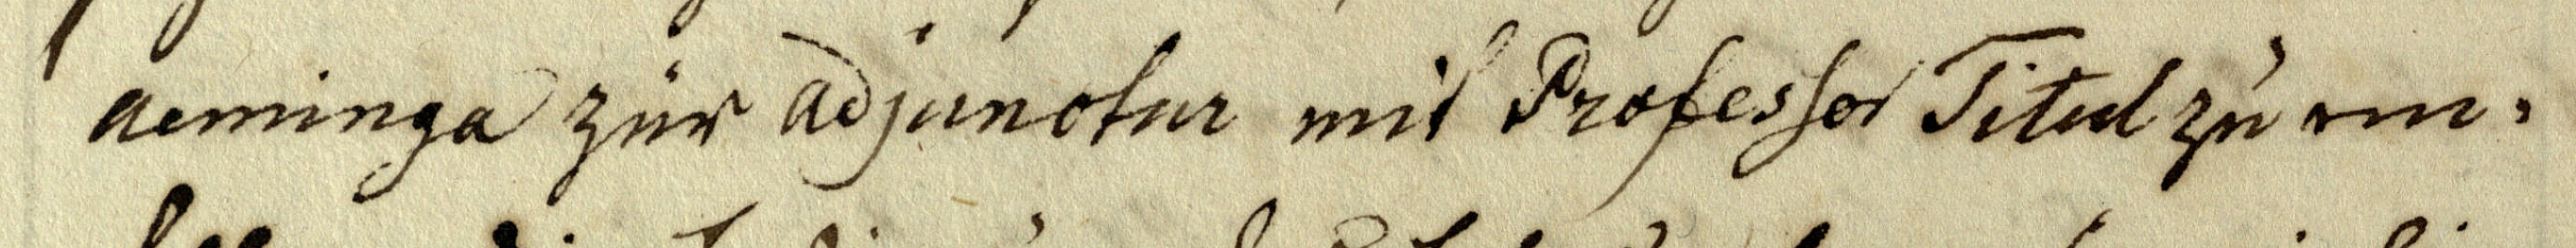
Aeminga zur Adjunctur mit Professor Titul zu em¬
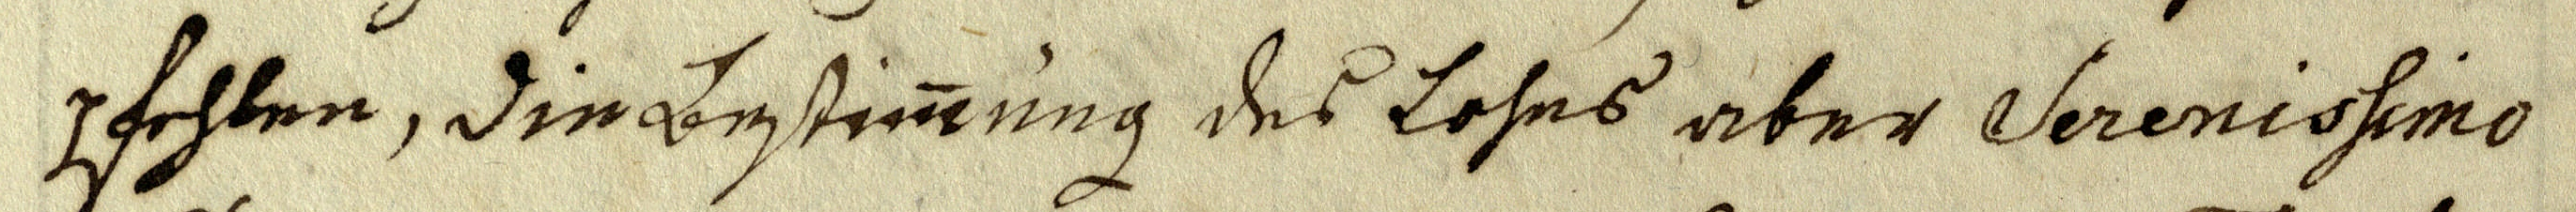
pfehlen, die Bestimung des Lohns aber Serenissimo
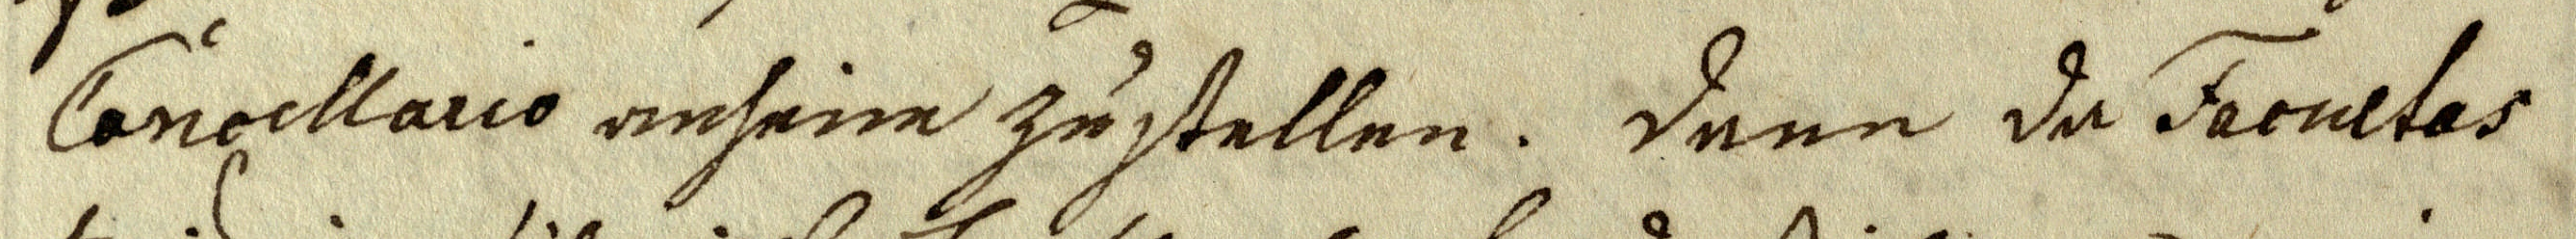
Cancellario anheim zu stellen. Denn da Facultas
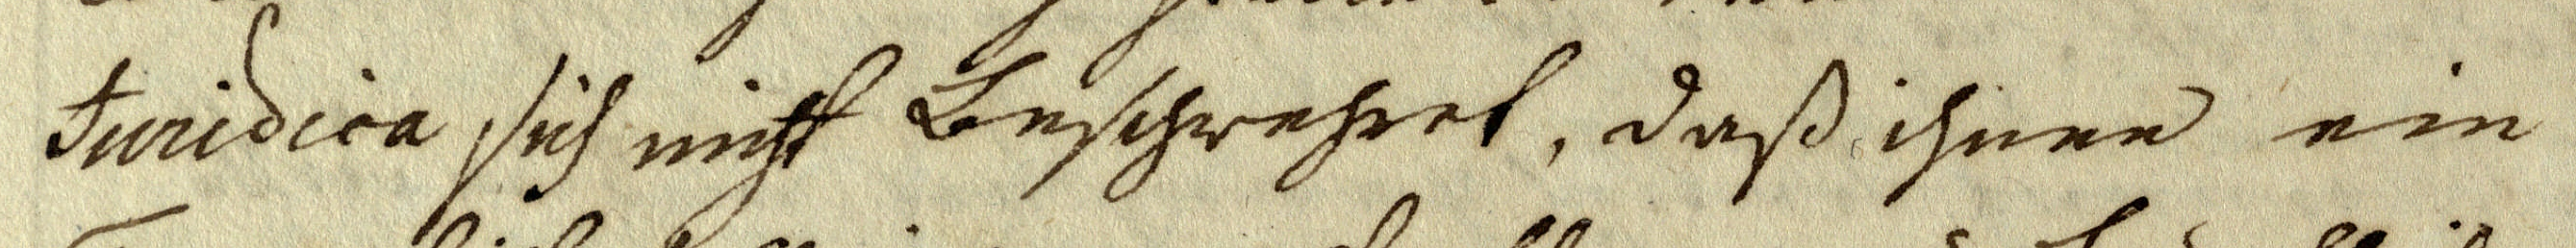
Juridica sich nicht beschwehret, daß ihnen ein
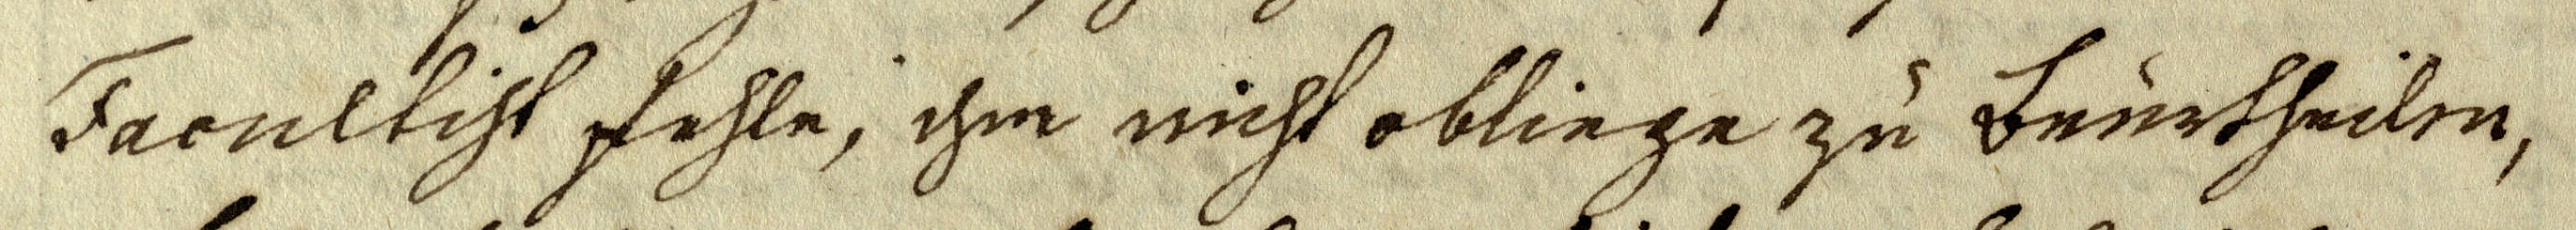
Facultist fehle, ihm nicht obliege zu beurtheilen,
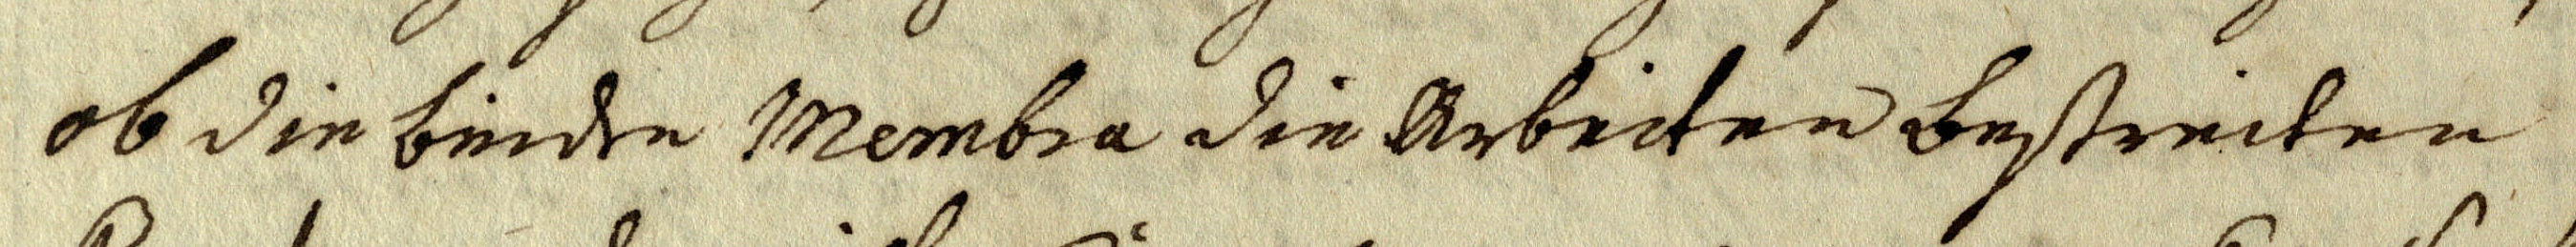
ob die beiden Membra die Arbeiten bestreiten
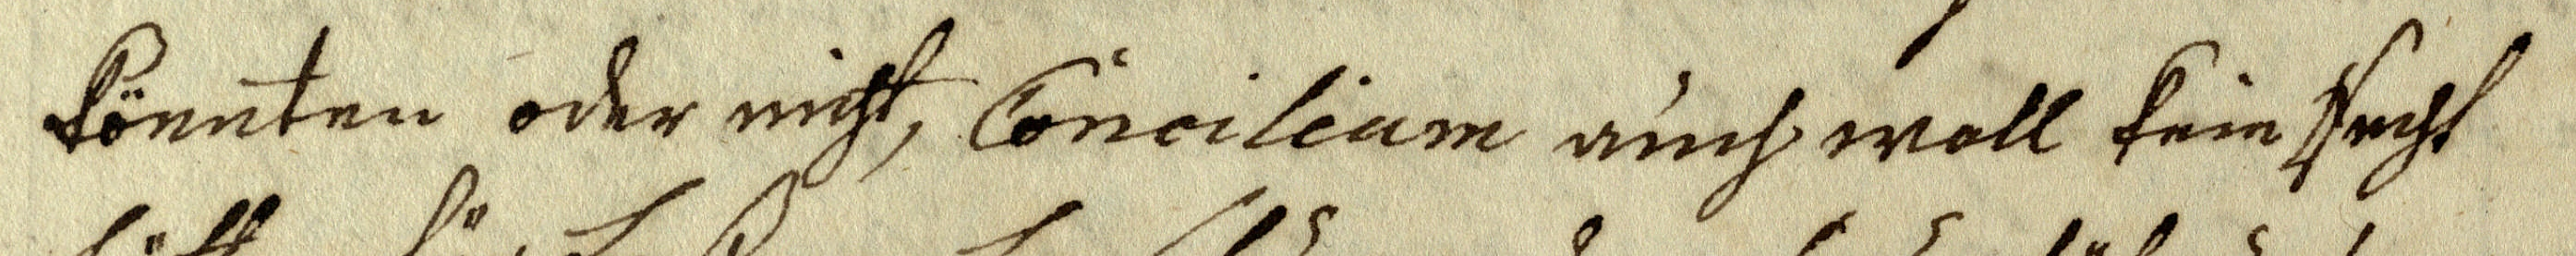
könnten oder nicht, Concilium auch wol kein Recht
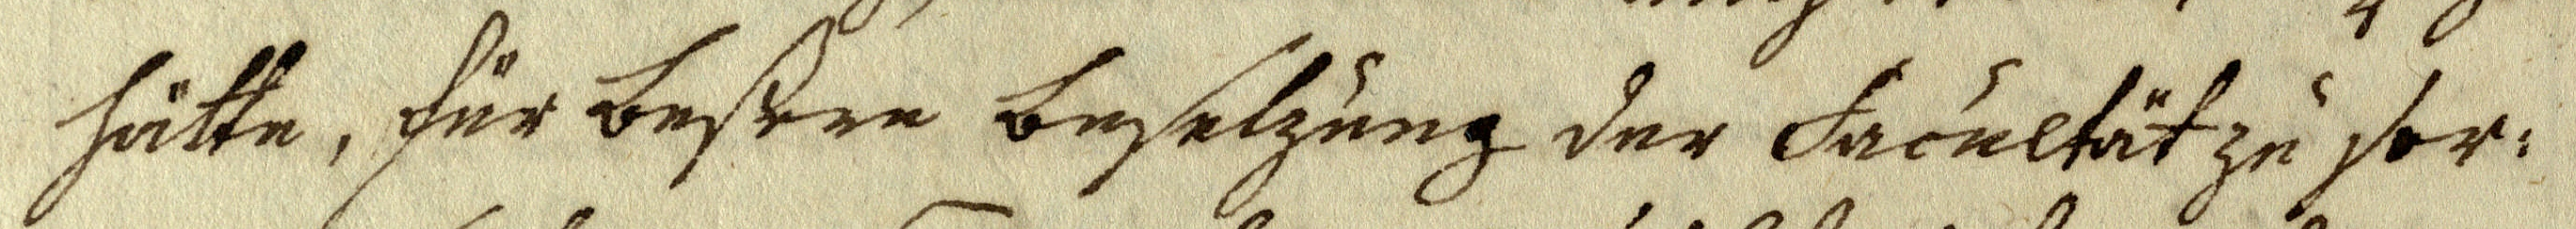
hätte, für beßere Besetzung der Facultät zu sor¬
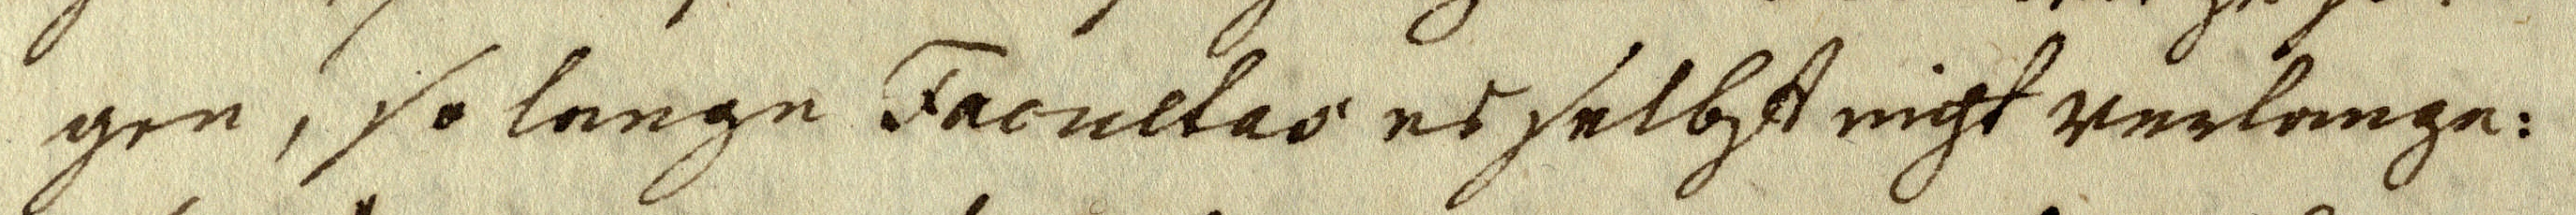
gen, so lange Facultas es selbst nicht verlange,
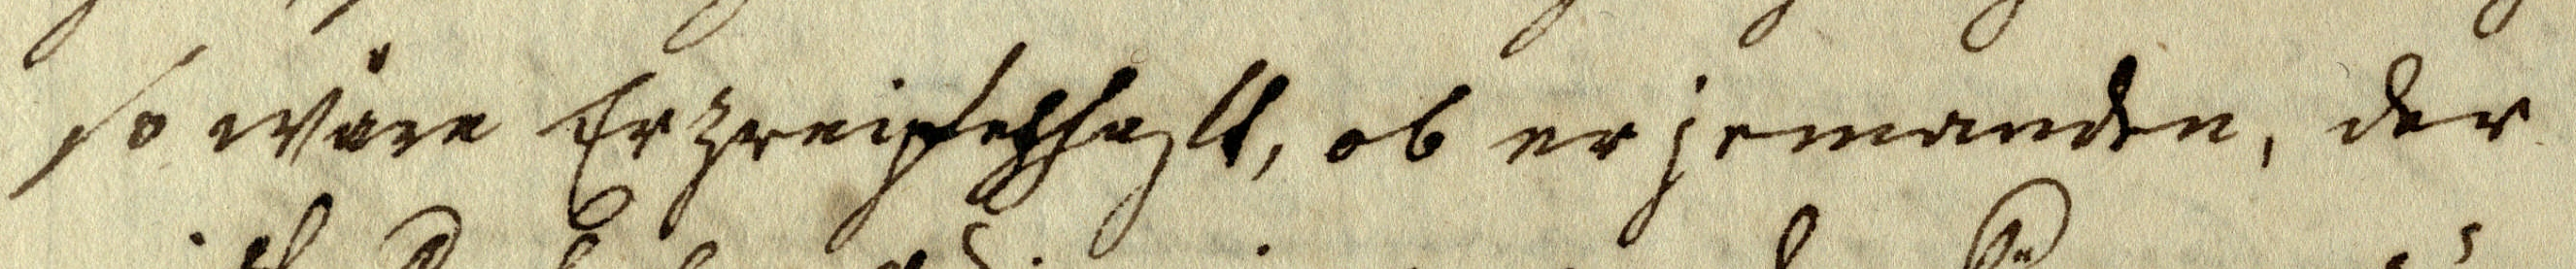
so wäre Er zweifelhaft, ob er jemanden, der
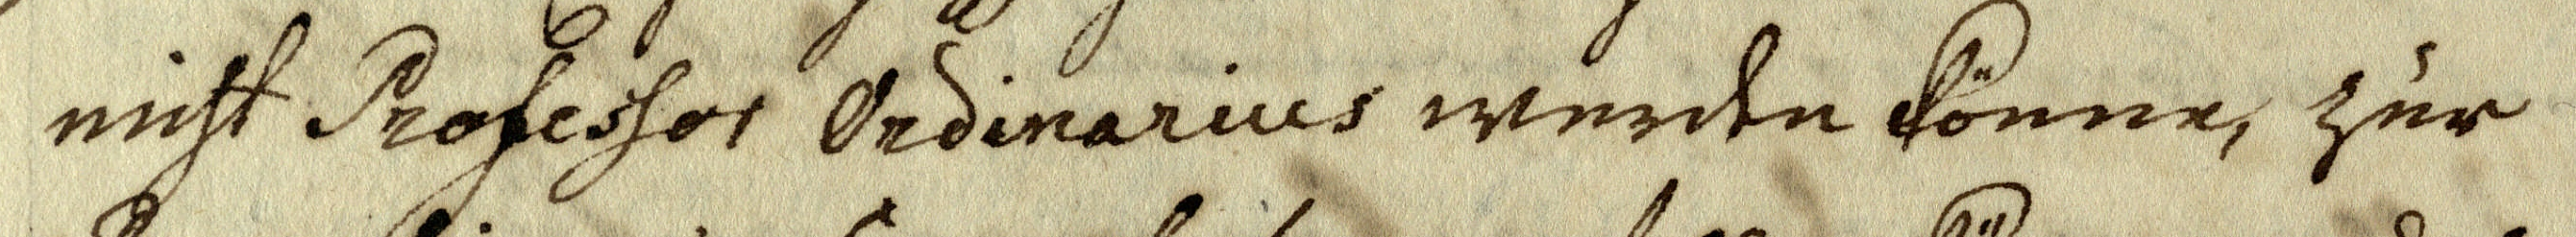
nicht Professor, Ordinarius werdenkönne, zur
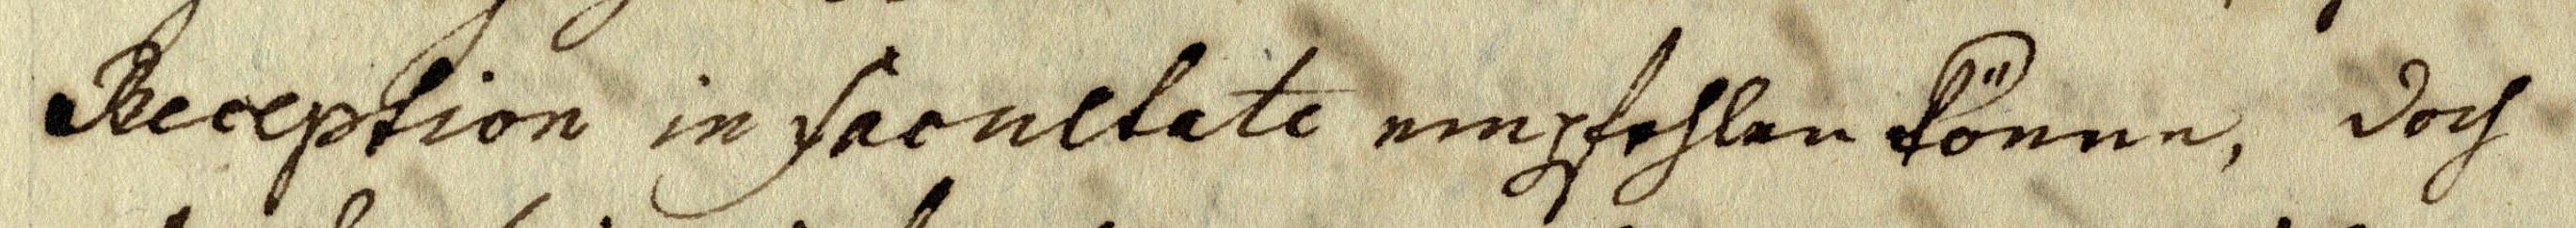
Reception in Facultate empfehlen könne, doch
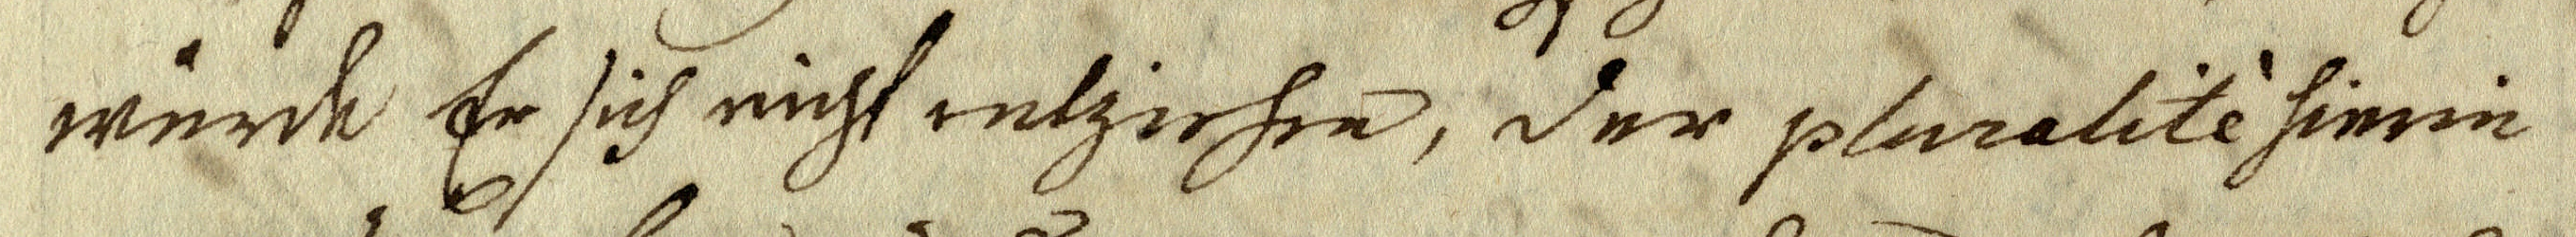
würde Er sich nicht entziehen, der pluralite hierin
